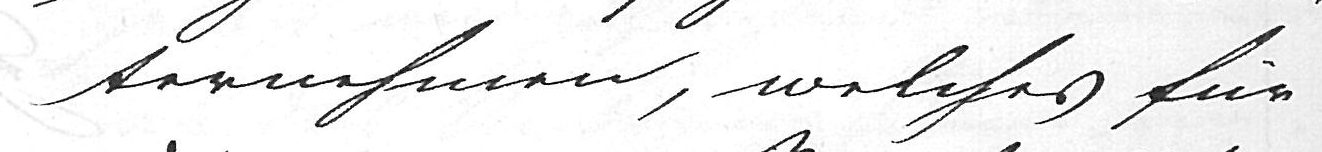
ternehmen, welches für
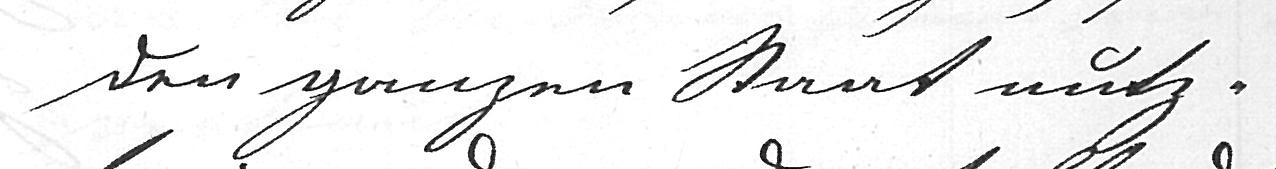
den ganzen Staat nutz-
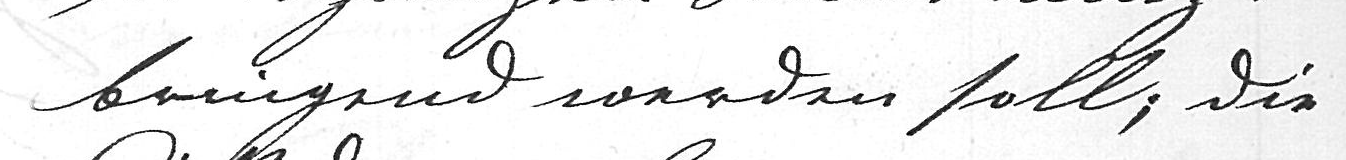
bringend werden soll; die
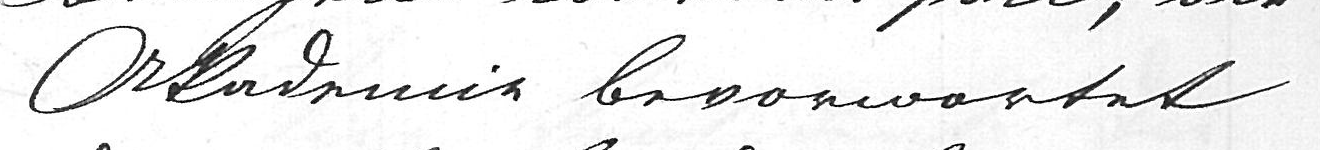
Akademie bevorwortet
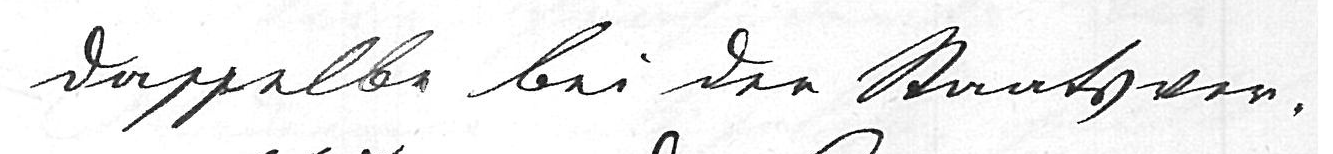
dasselbe bei der Staatsver-
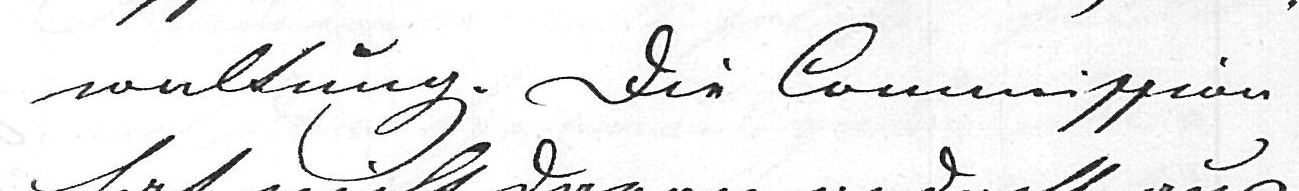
waltung. Die Commission
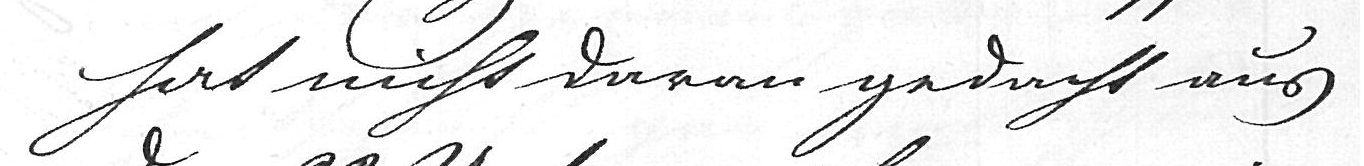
hat nicht daran gedacht aus
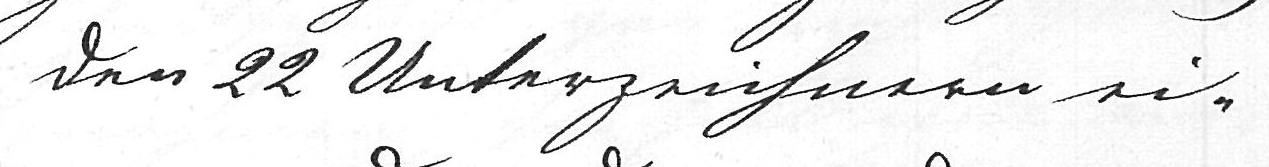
den 22 Unterzeichnern ei-
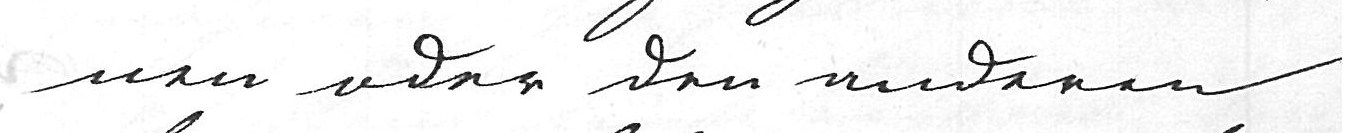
nen andere den anderen
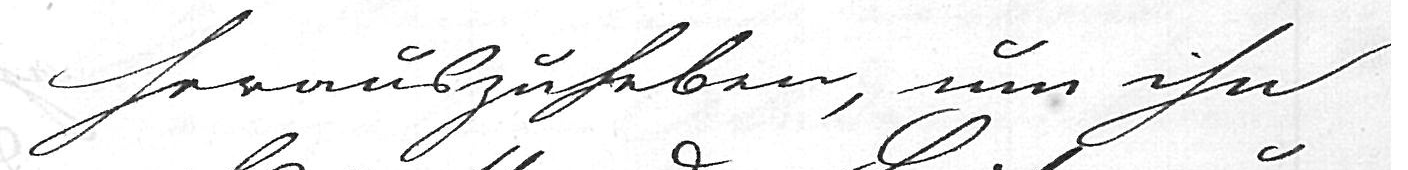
herauszuheben, um ihn
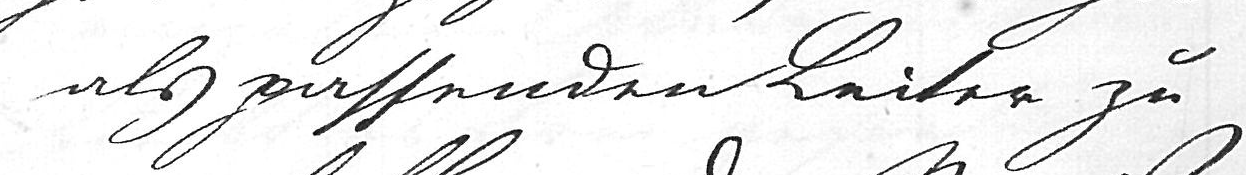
als passenden Leiter zu
